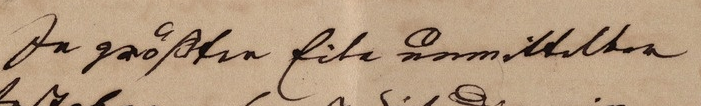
In größter Eile unmittelbar
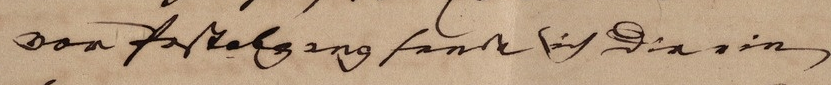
vor Postabgang sende ich dir ein
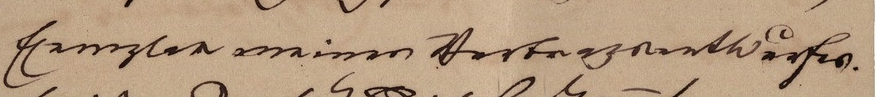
Exemplar meines Vertragsentwurfes.
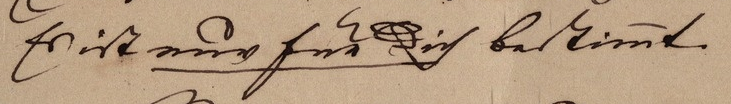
Es ist nur für Dich bestimmt.
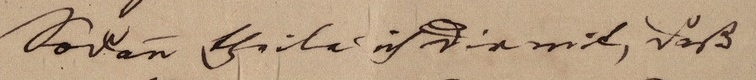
Sodann theile ich dir mit, daß
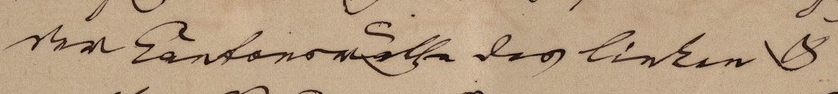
der Cantonsräthe des linken &
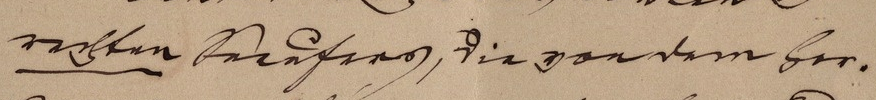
rechten Seeufers, die von dem Hor-
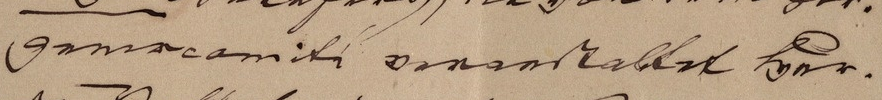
genercomité veranstaltet wur-
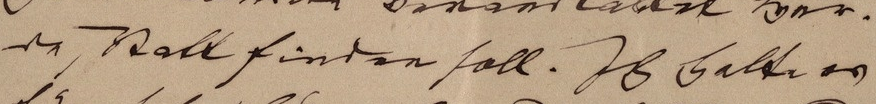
de, Statt finden soll. Ich halte es
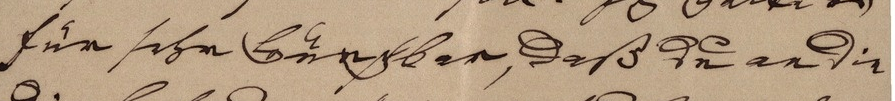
für sehr wünschbar, daß Du an die
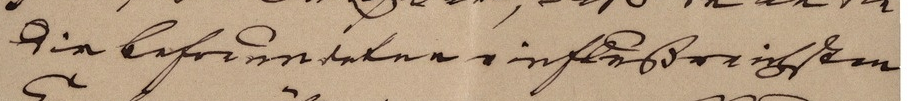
dir befreundeten einflußreichsten
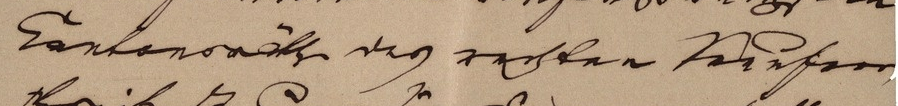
Cantonsräthe des rechten Seeufers
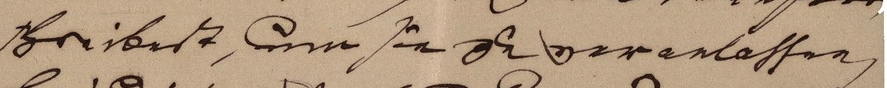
schreibest, um sie zu veranlassen,
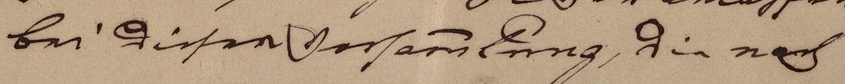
bei dieser Versammlung, die nach
